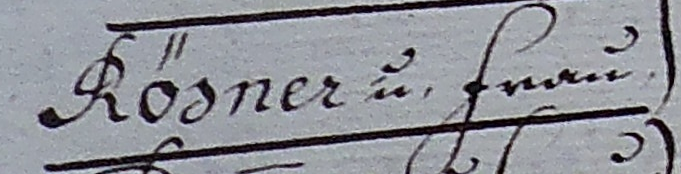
Rösner u. Frau
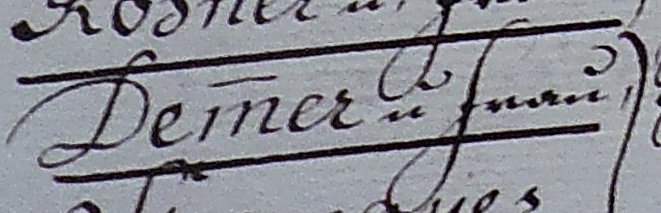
Dem̅er u Frau,
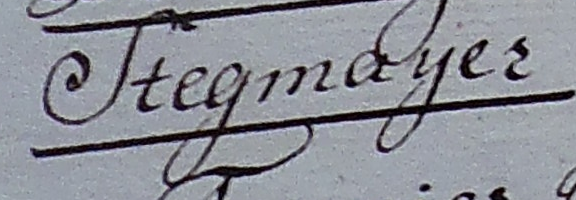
Stegmayer
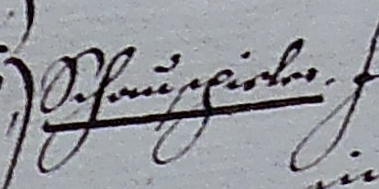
Schauspieler.
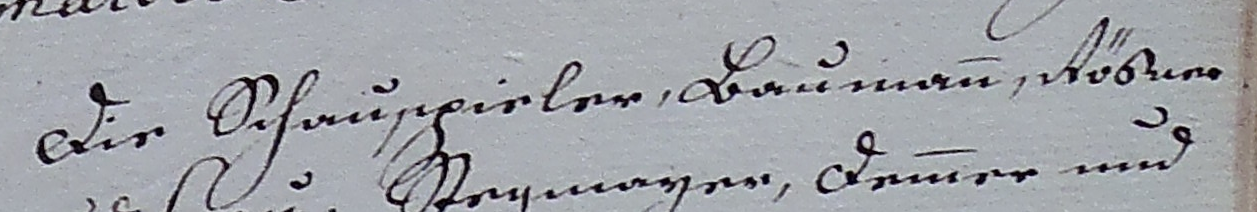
Die Schauspieler: Bauman̅, Rösner
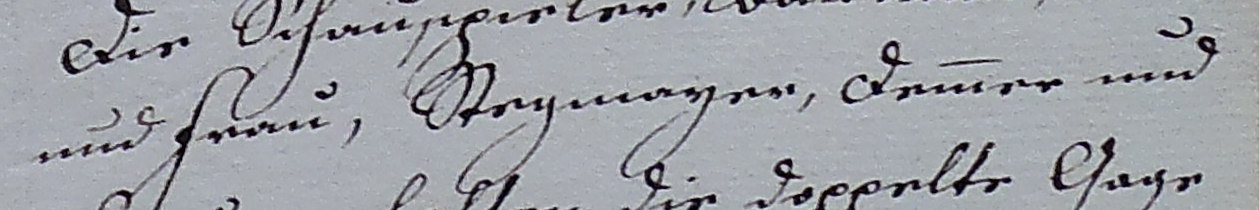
und Frau, Stegmayer, Dem̅er und
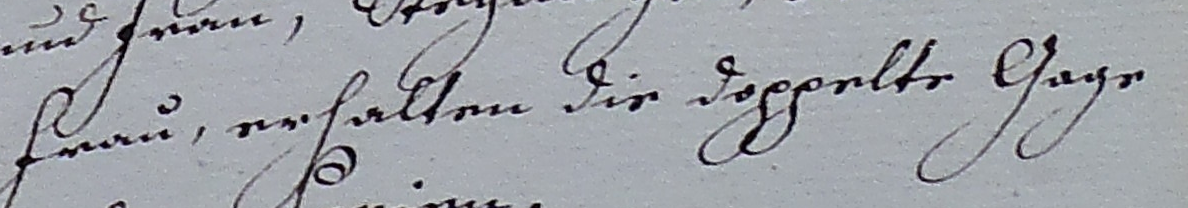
Frau, erhalten die doppelte Gage
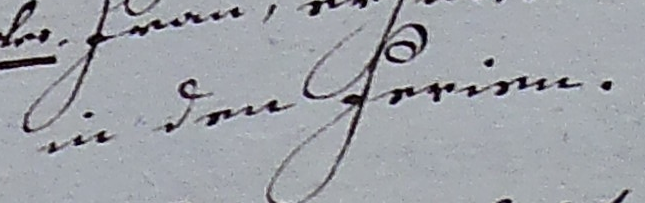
in den Ferien.
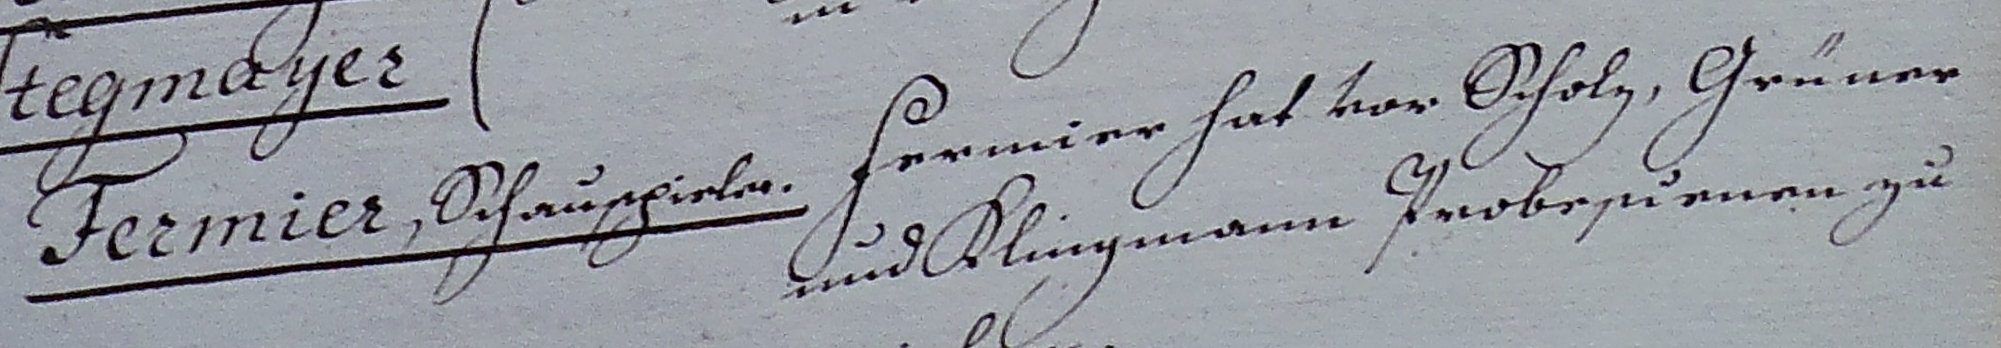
Fermier, Schauspieler. Fermier hat vor Scholz, Grüner
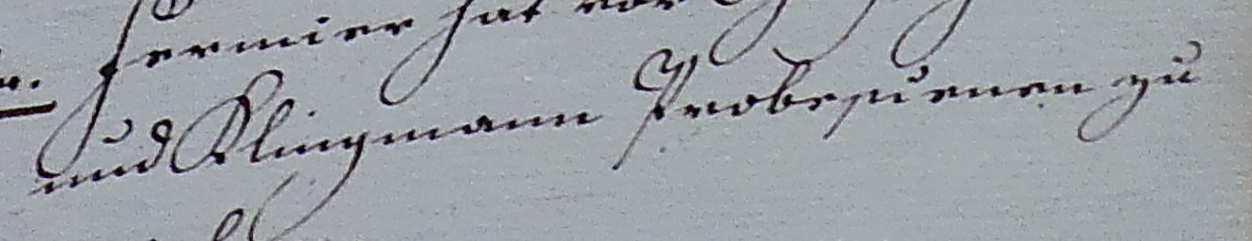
und Klingmann Probescenen zu
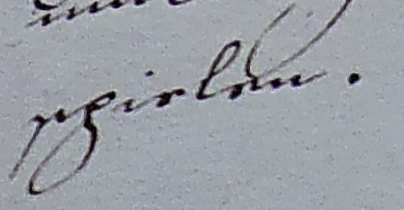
spielen.
